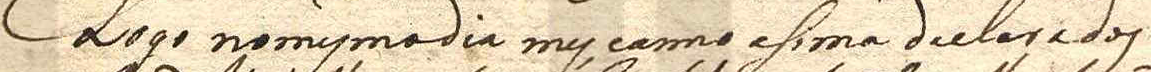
E Logo no mesmo dia, mes, e anno asima declarados
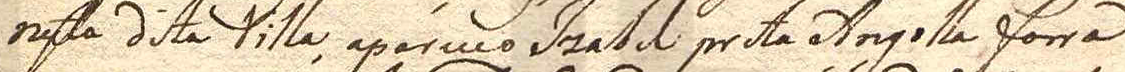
nesta dita Villa, apareceo Izabel preta Angolla forra
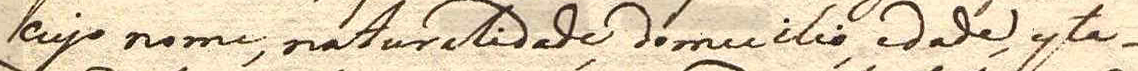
cujo nome, naturalidade, domecilio, edade, esta
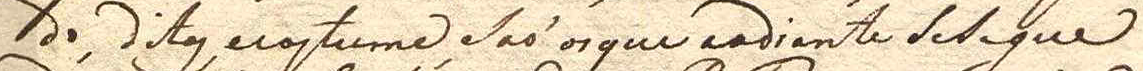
do, ditos, e costume, saõ os que aodiante se segue
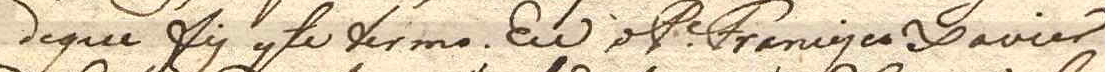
de que fis este termo. Eu o P.e Francisco xavier
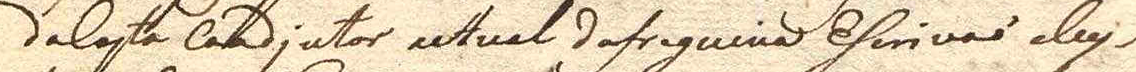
da Costa Coadjutor actual da freguezia Escrivaõ eley
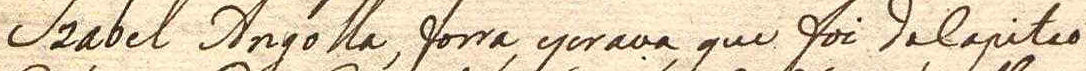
Izabel Angolla, forra, escrava, que foi do Capitaõ
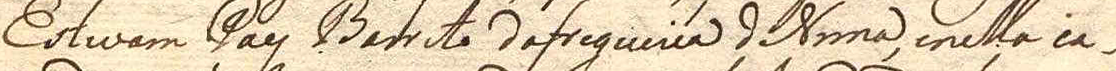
Estevam Paes Barreto da freguezia de Vnna, e nella ca
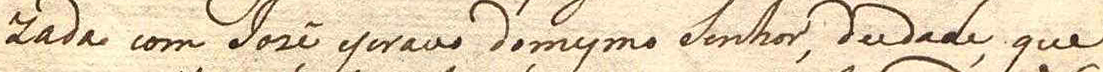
zada com Iozê escravo do mesmo Senhor, de edade, que
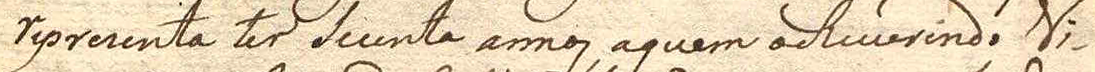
reprezenta ter secenta annos, a quem o Reuerendo Vi
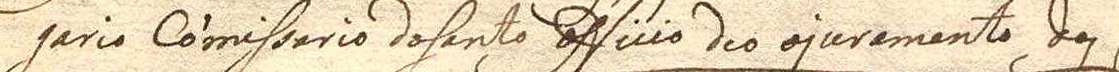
gario Cōmissario do santo officio deo o juramento dos
